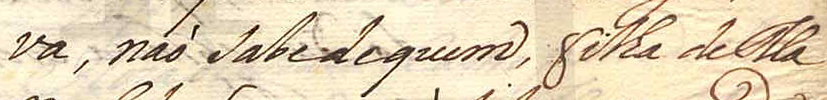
va, não sabe de quem, filha de Ma
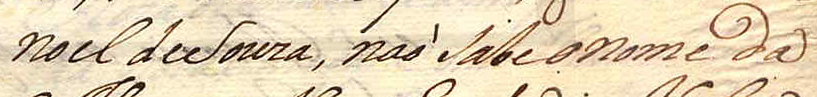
noel de Souza, naõ sabe o nome da
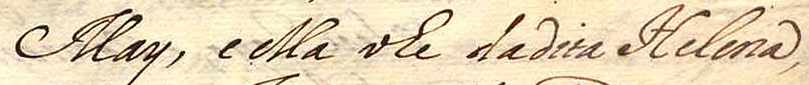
May, e ella o he da dita Helena,
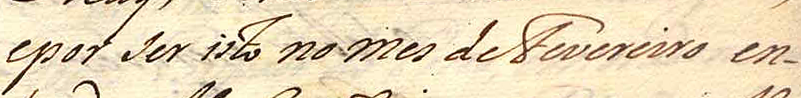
e por ser isto no mes de Fevereiro en
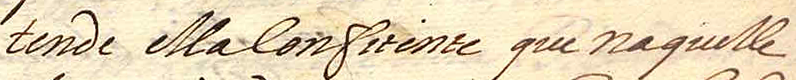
tende ella Confitente que naquelle
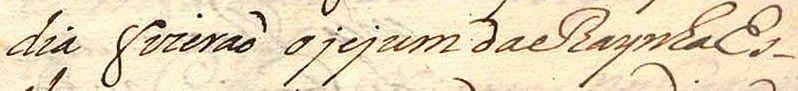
dia fizeraõ o jejum da Raynha Es
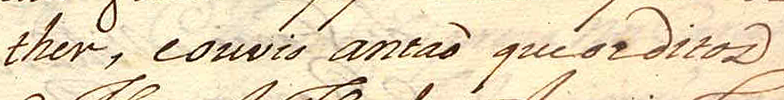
ther, e ouvio antaõ que os ditoz
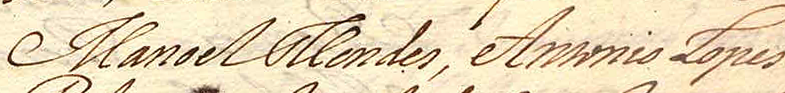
Manoel Mendes, Antonio Lopes
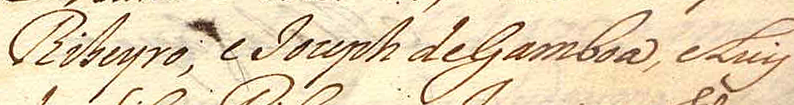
Ribeyro, e Iozeph de Gamboa, e Luis
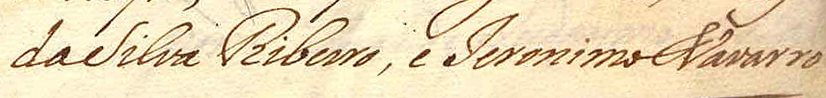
da Silva Ribeiro, e Ieronimo Navarro
